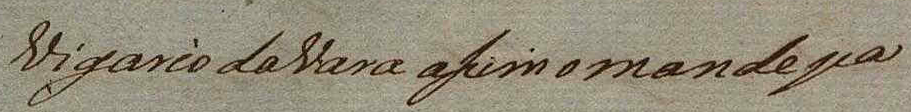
Vigario da Vara assim o mande pa
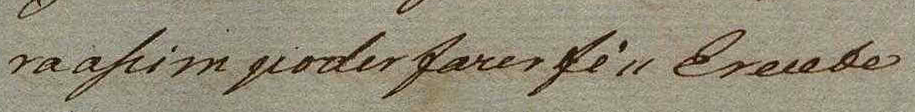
ra assim poder fazer fé // E recebe
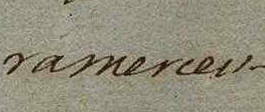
ra merce //
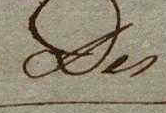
Des
